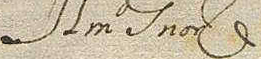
ILmo Snor̄
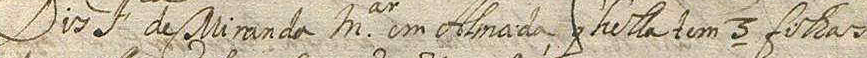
Dis Fca de Miranda m.ar em Almada, q̄ hella tem 3 filhas
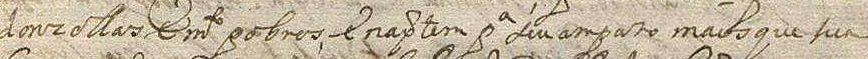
donzellas e mto pobres, e naõ tem pa seu amparo mais que sua
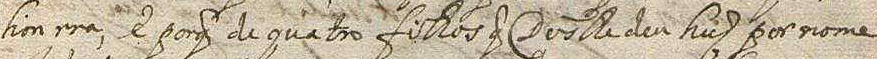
honrra, e porq̄ de quatro filhos q̄ Des̄ lhe deu hū por nome
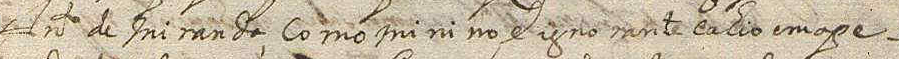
Anto de Miranda, como minino, e ignorante cahio em o pe
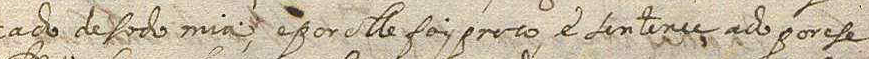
cado de sodomia; e por elle foy prezo, e sentençeado por ese
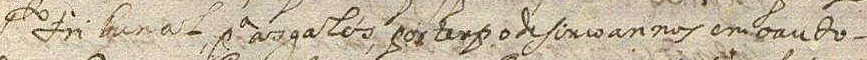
Sto tribunal, pa as galés, por tenpo de sinco annos em o auto
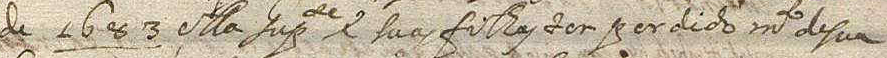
de 1683, ella supte e suas filhas tem perdido mto de sua
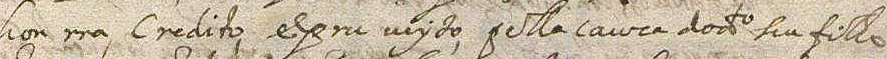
honrra, Credito, e pruueyto, pella cauza do d̄o seu filho
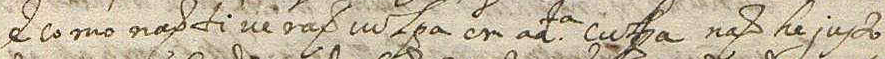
e como naõ tiueraõ culpa em a d̄.a culpa naõ he justo
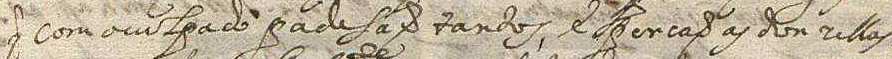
q̄ com o culpado padesaõ tantos, e percaõ as donzellas
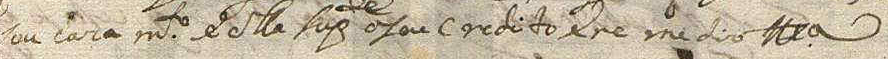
seu cazam.to e ella supte o seu credito e remedio &c.a
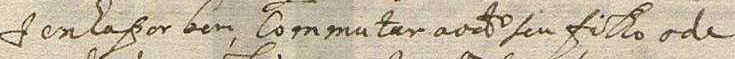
tenha por bem, commutar ao d̄o seu filho o de
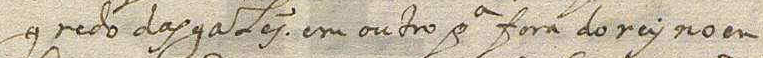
gredo das gales̄. em outro pa fora do reyno em
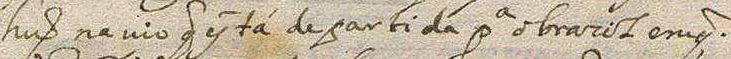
hū nauio q̄ está de partida pa o brazil em q̄.
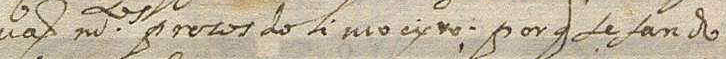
uaõ m.tos prezos do limoeyro; porq̄ sesando
